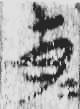十月
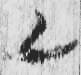乙
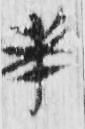未
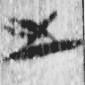之
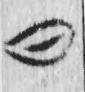日
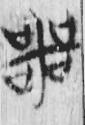噩
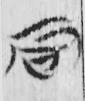君
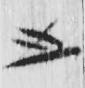之
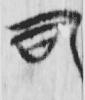司
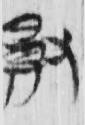敗
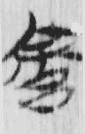舒
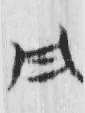丹
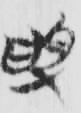受
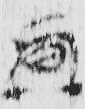○（期）
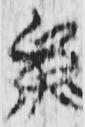○（爨）
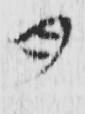月
